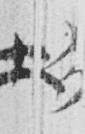○（郤）
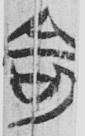奇
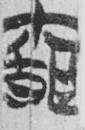○（聞）
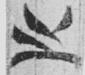之
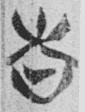告
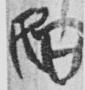姑（苦）
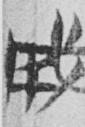○（成）
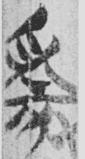○（家）
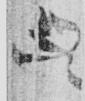父
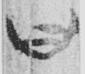曰
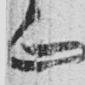㠯（以）
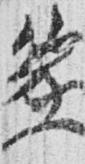○（吾）
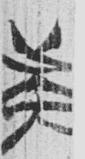族
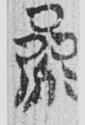參（三）
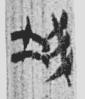郤
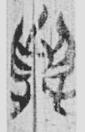與
